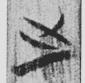之
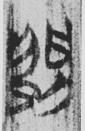{門夕刀}（間）
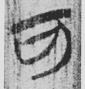可
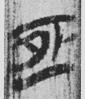亙
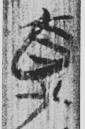植
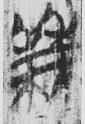兼
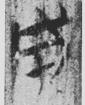成
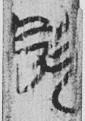{石丩}
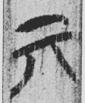亓
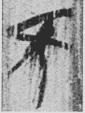不
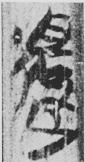還
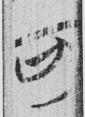可
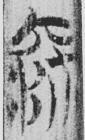深
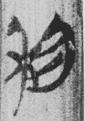利
